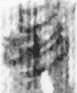革
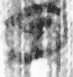○（圓）
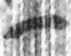一
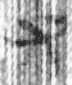又
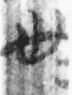三十
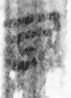司（笥）
